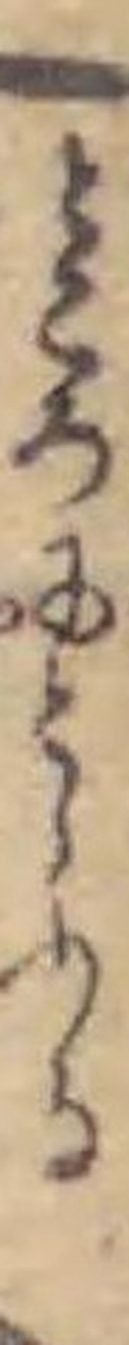ところにとしふる
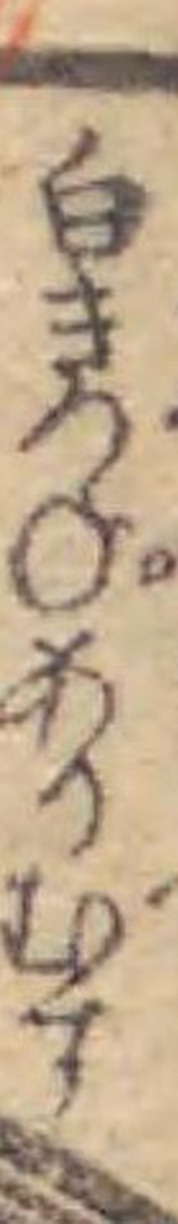白きつねありむす
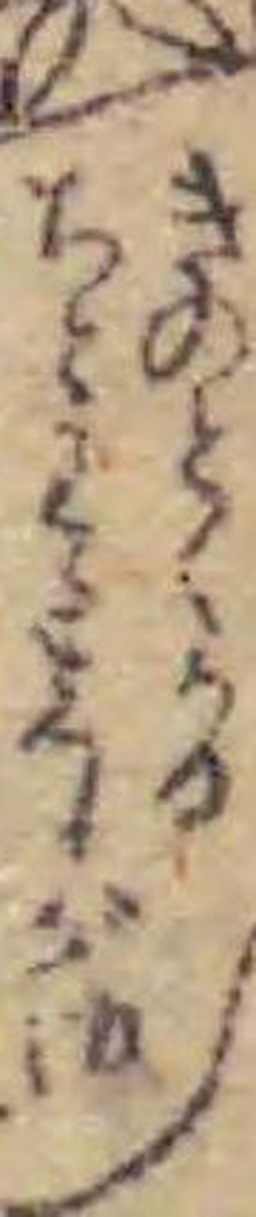ちとわたくしが御
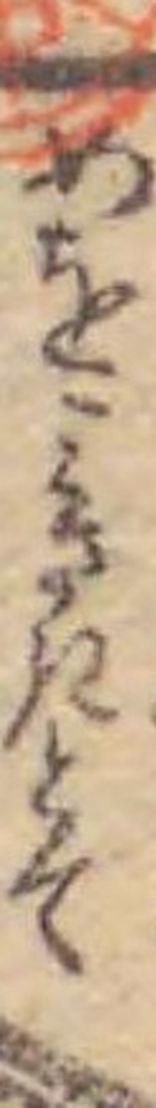めをみさきとて
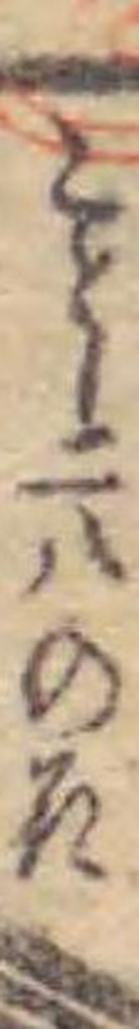ことし二八の花
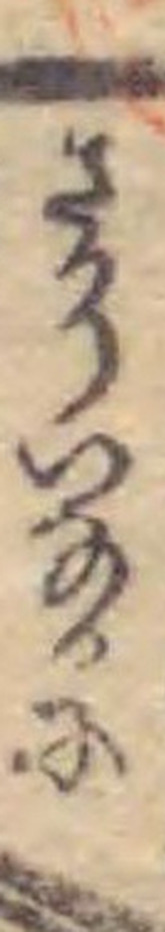さかりいなかに
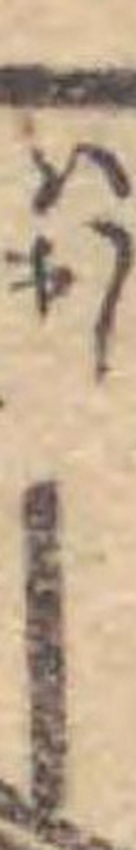はおし
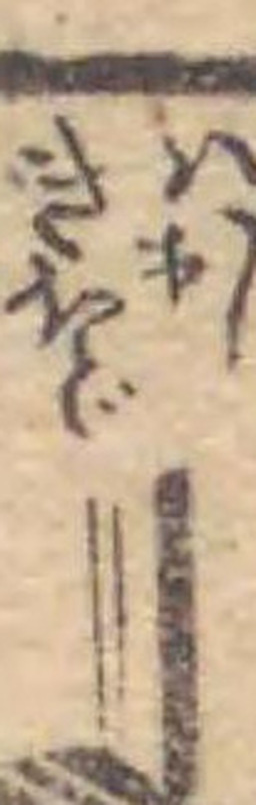きほど
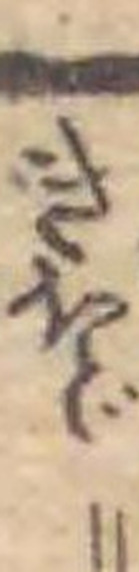きほど
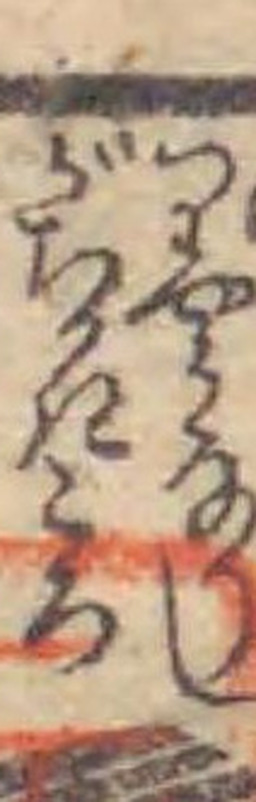がちかきころ
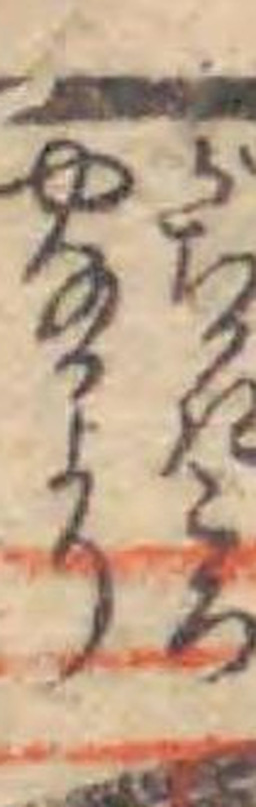やなかより
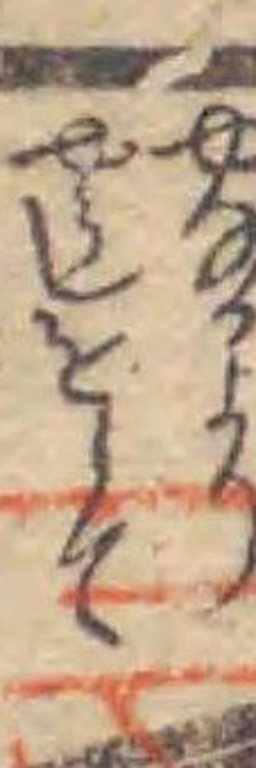やうしをして
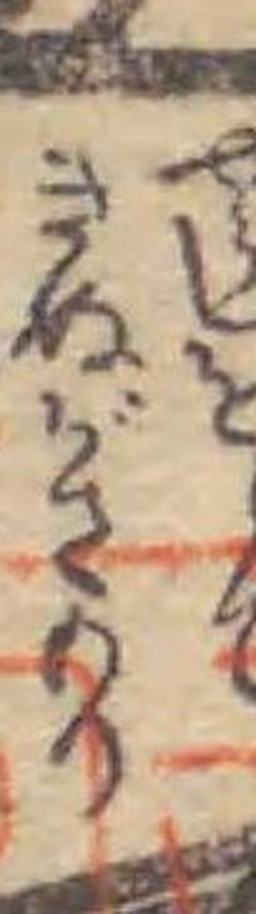きぬがさもり
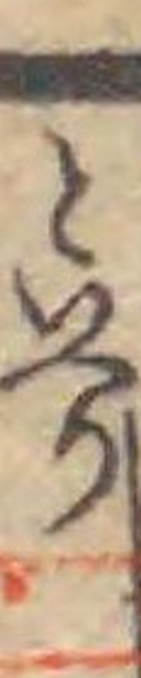といへり
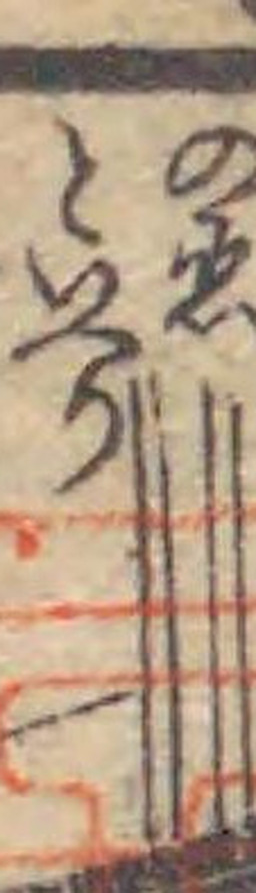といへり
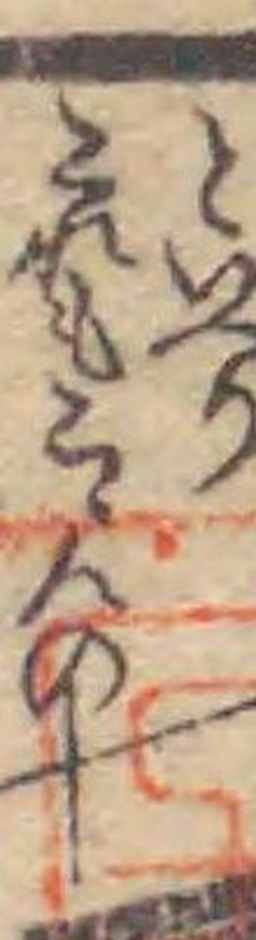これもこゝんの
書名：扨化狐通人 : 2巻
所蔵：国立国会図書館 National Diet Library, JAPAN
